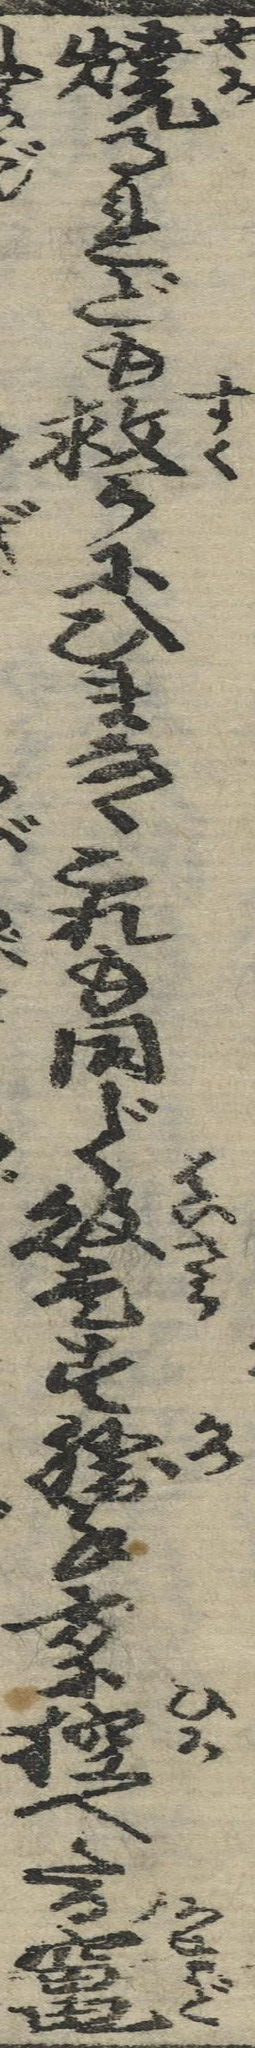焼るれども救うにひまなくこれも同じく敗走す勝子方に控へたる竃
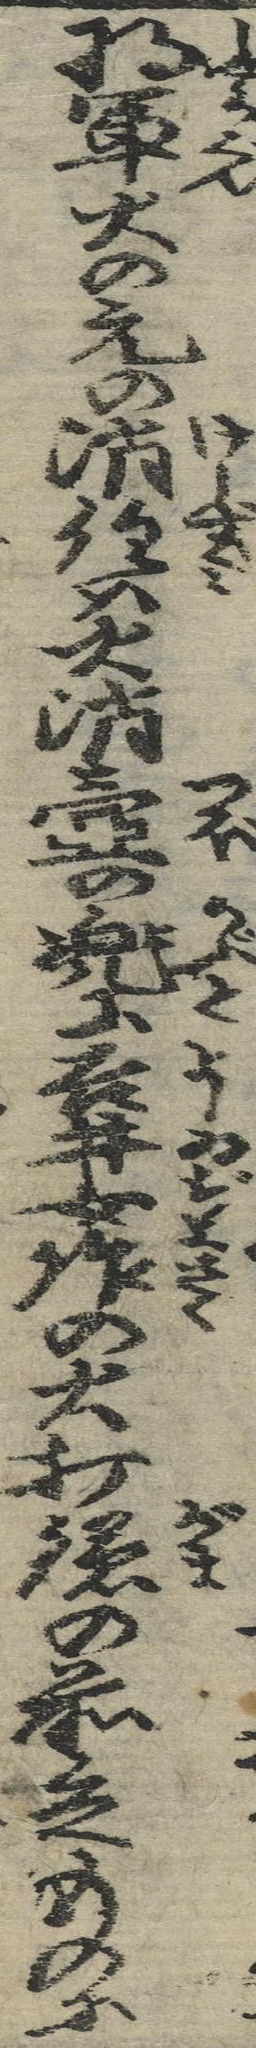将軍火の元の消住は火消壺の兜に吉井女作の火打鎌の前立ものに
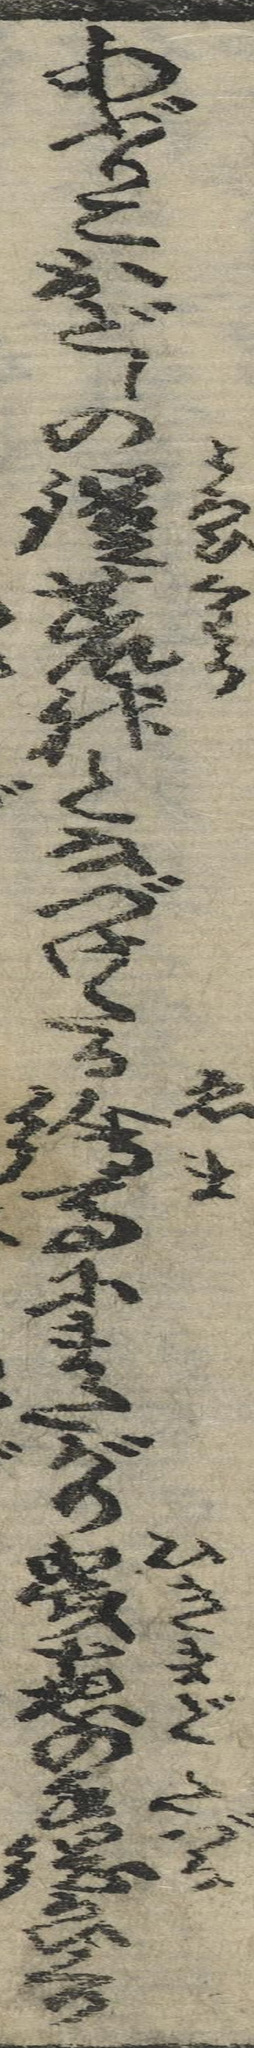あぶりこおどしの鎧若神となづけたる絵馬にまたがり曳窓の手綱かい方
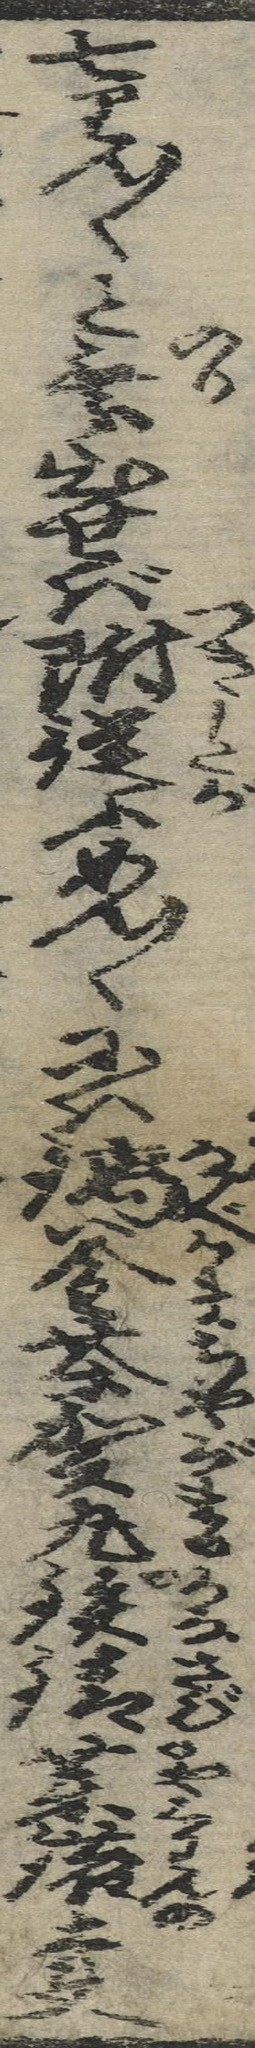七りん〳〵と乗出せば附従ふめん〳〵には鍋釜茶賀丸。鉄錆。薬罐太文
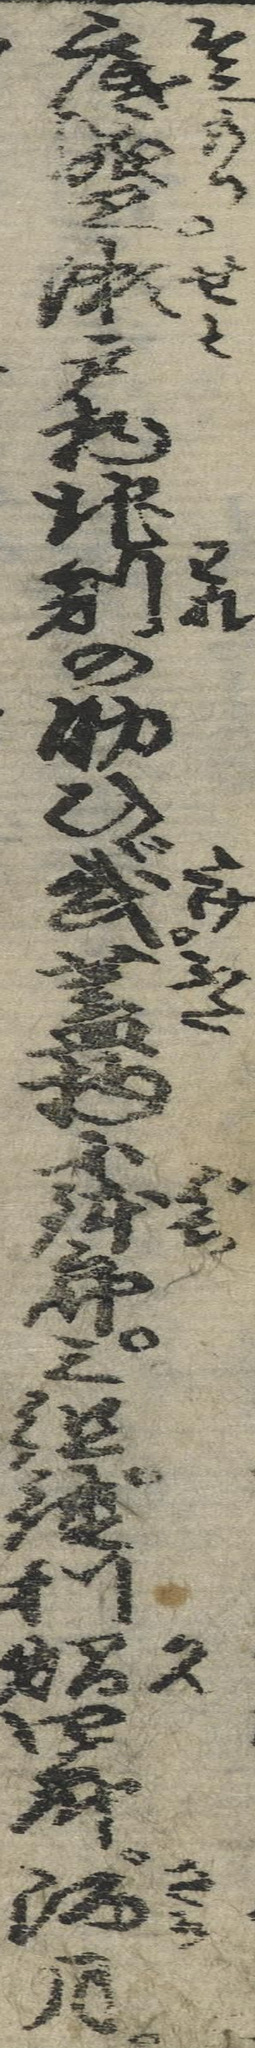底盛。瀬戸物地割の助ひゞ武。蓋物小鉢郎。三組。徳利燗四郎。酒月。
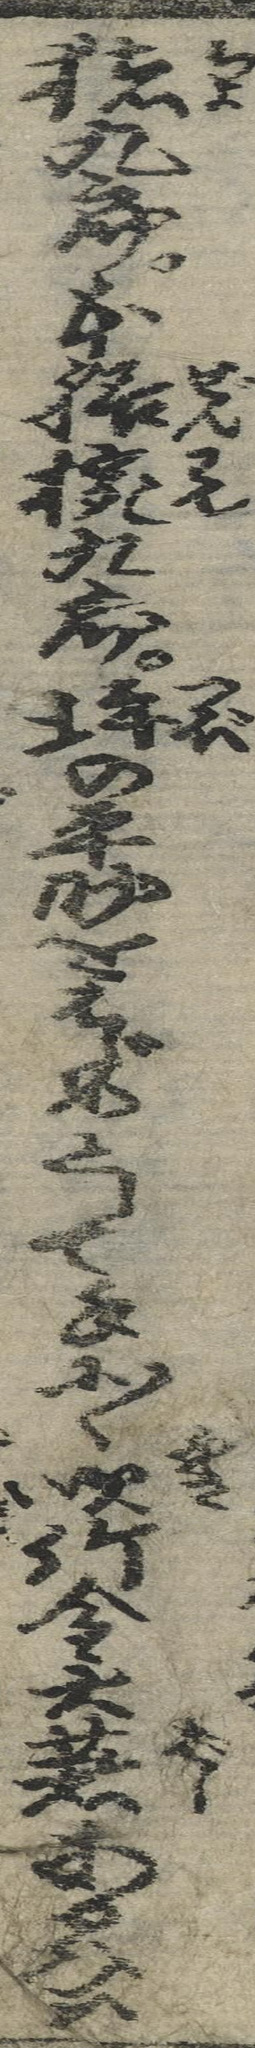猪九郎。本膳椀九郎。坪の平助をはじめとして手に〳〵吹竹金火箸あるひは
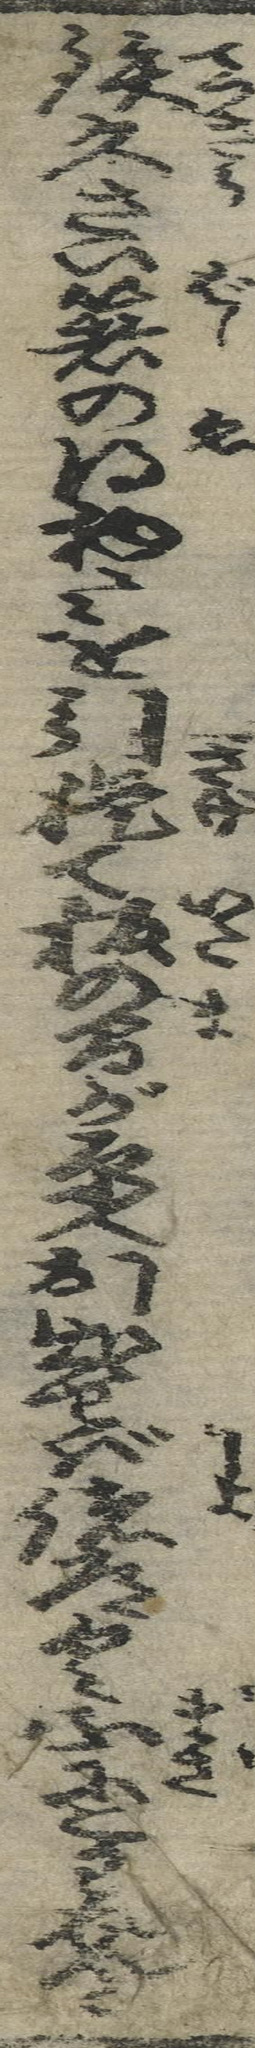鉄久さい箸の得物之を引提て板の間が原へお出せば諸道具正にこわ

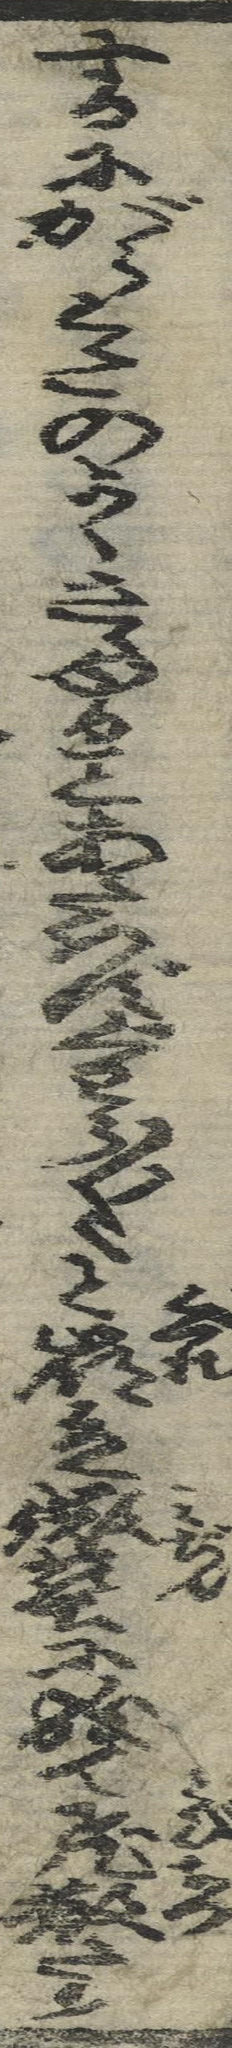するにがらくたのかヽさゆることあたはずぐら〳〵〳〵と崩立微塵に成て飛散たり
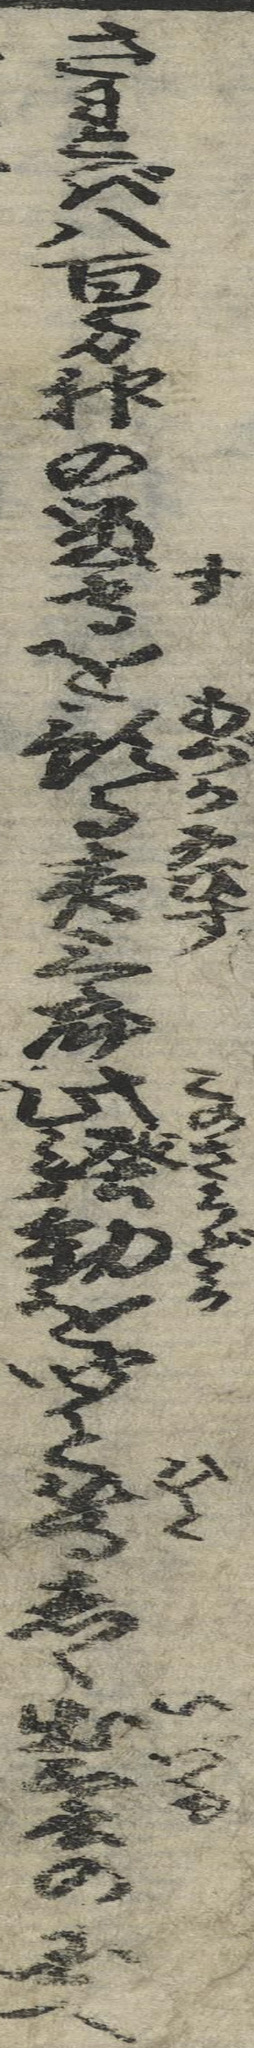されば八百万神の留守を預る夷三郎此撥動を聞と等しく出雲の国へ
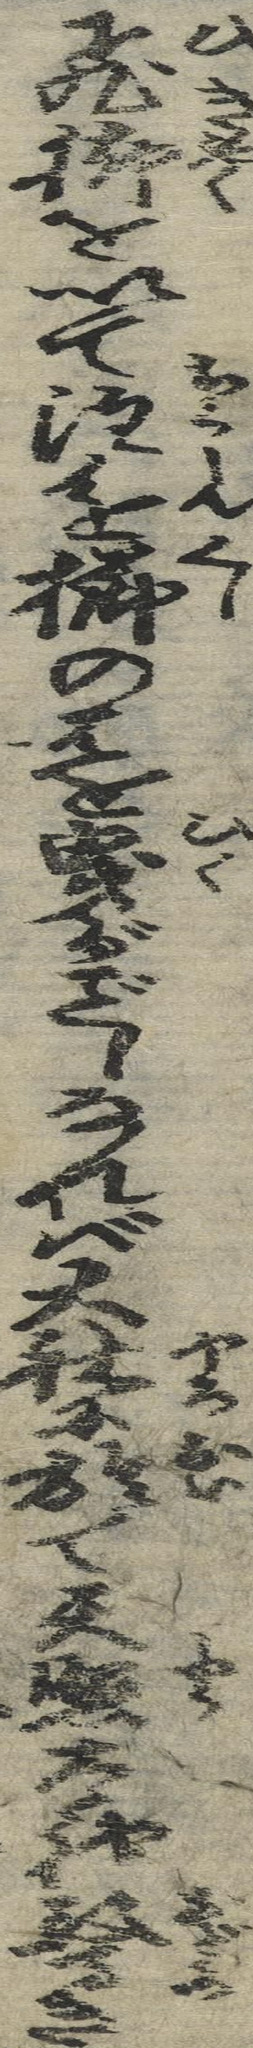飛脚を以て泡心櫛のはを曳がばしなれば大社に於て天照太神驚き
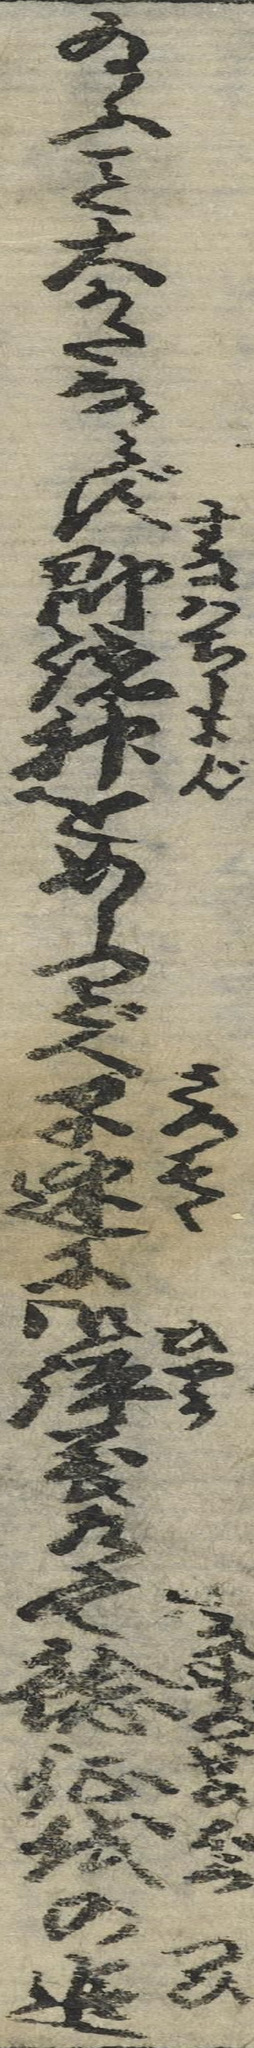給ふこと大かたならず即諸神をめしつどへ早速に御評義候も鯰征伐の追
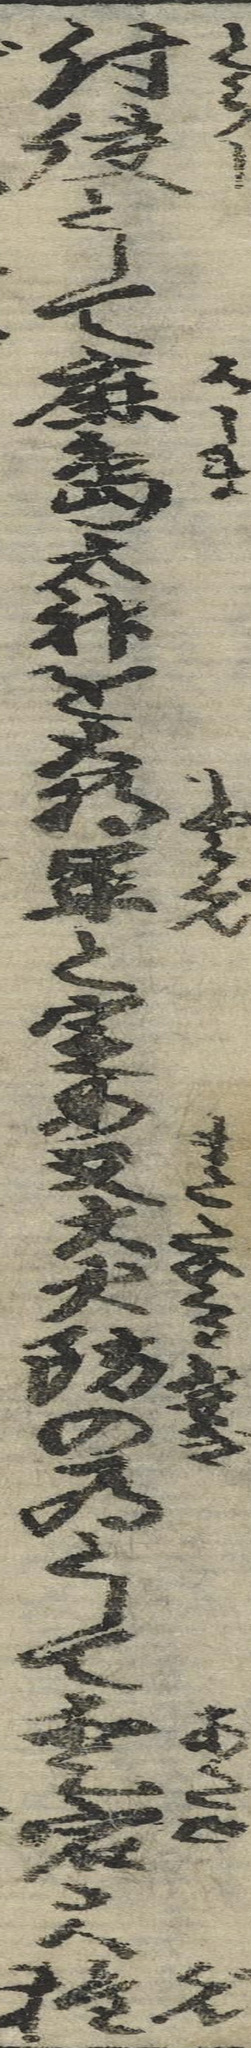討使として鹿島太神を大将軍と定め又大火防の為として愛宕かは権
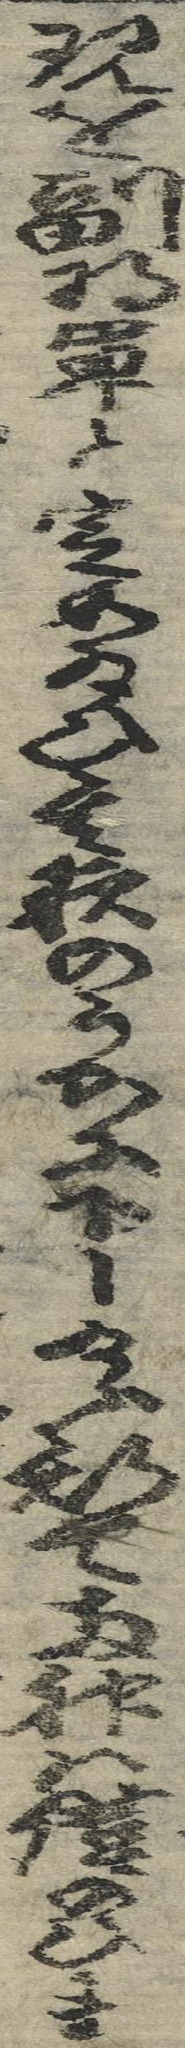現を副将軍と定め給へひ其夜のうちに下し給ふ郭て両神は僅のひま
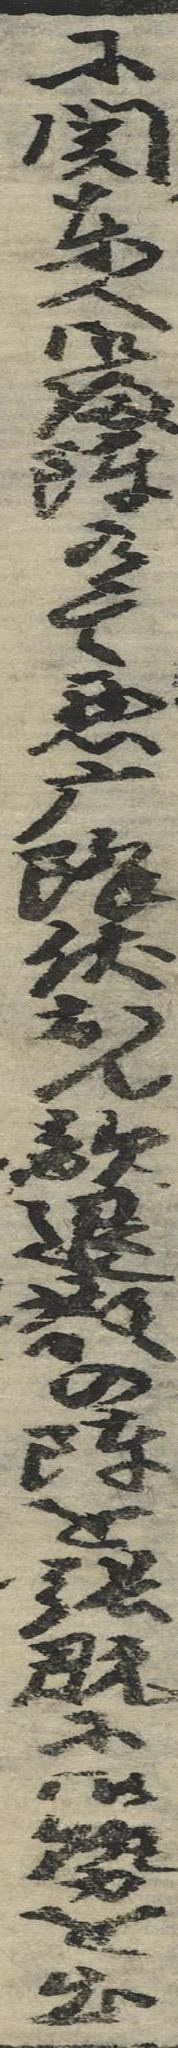に関東へ御帰陣候て悪魔降伏おん敵退散の陣を張既に御勢を出
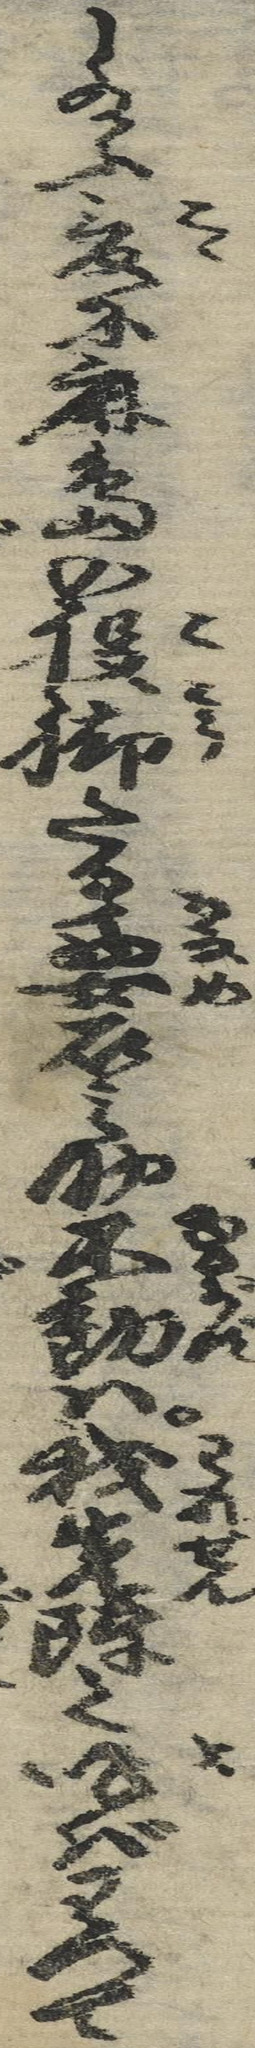し給ふ爰に鹿島の股肱たる要石之助不動は。我先陣と呼ばわつて
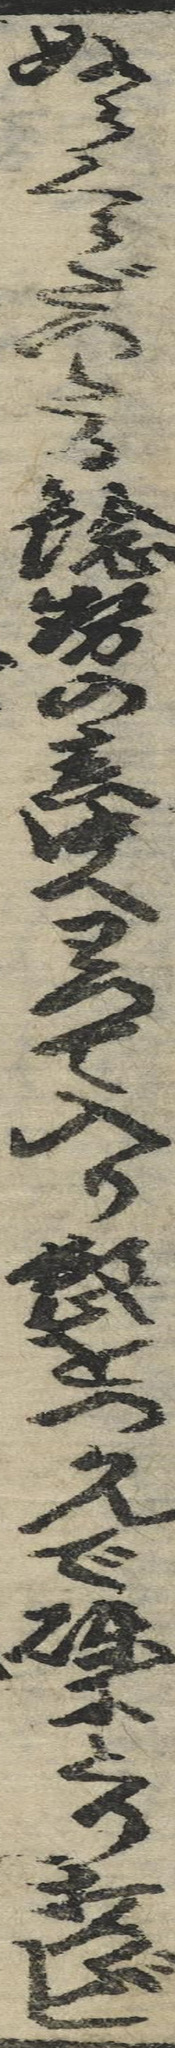ぬらくらだいたる鯰勢の真中へわつて入り髭をつかんで礫にとり打つべし
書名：鯰太平記混雑ばなし
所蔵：東京大学地震研究所図書室 Earthquake Research Institute Library, The University of Tokyo, JAPAN
